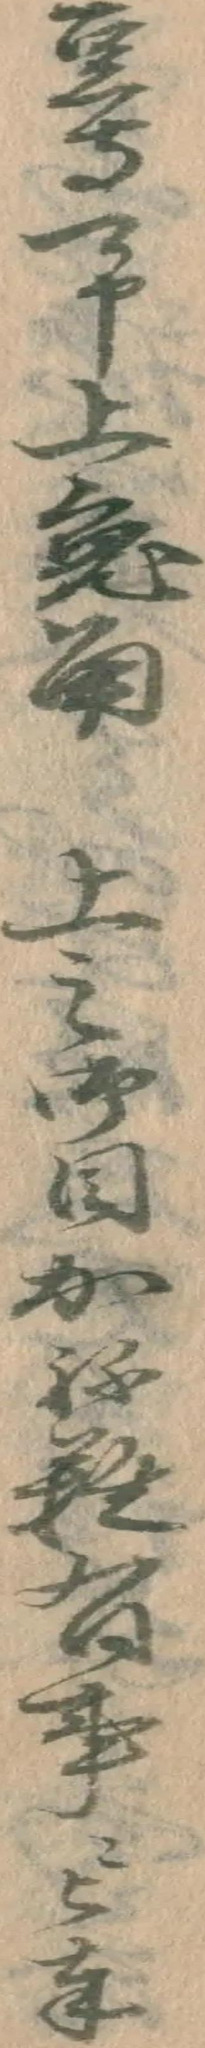豆守可申上兎角上之御目加祢難有殊に被奉
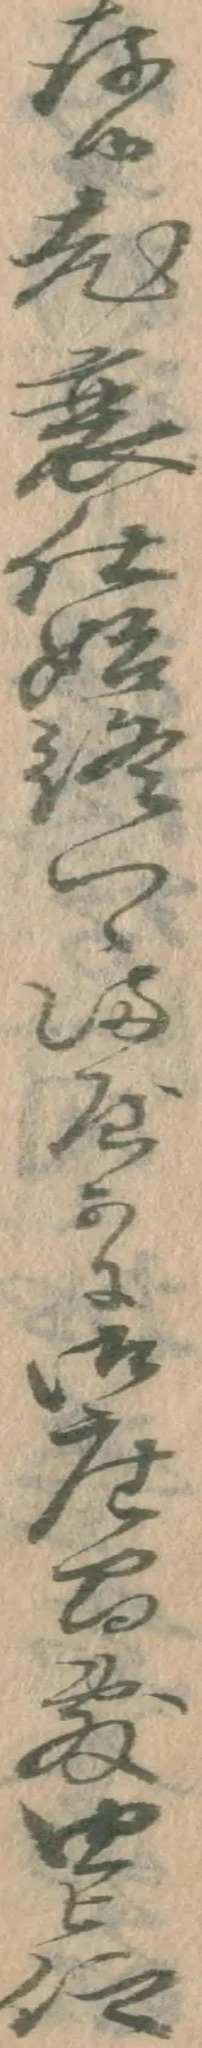存候老衰仕始終つゝ満屋可尓御座間敷由被仰
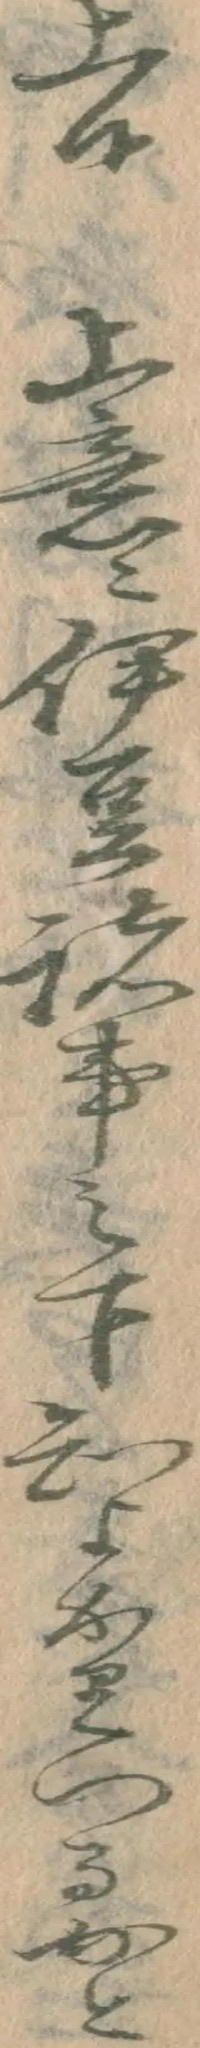上候上意に伊豆諸事之下知よか里つるかと
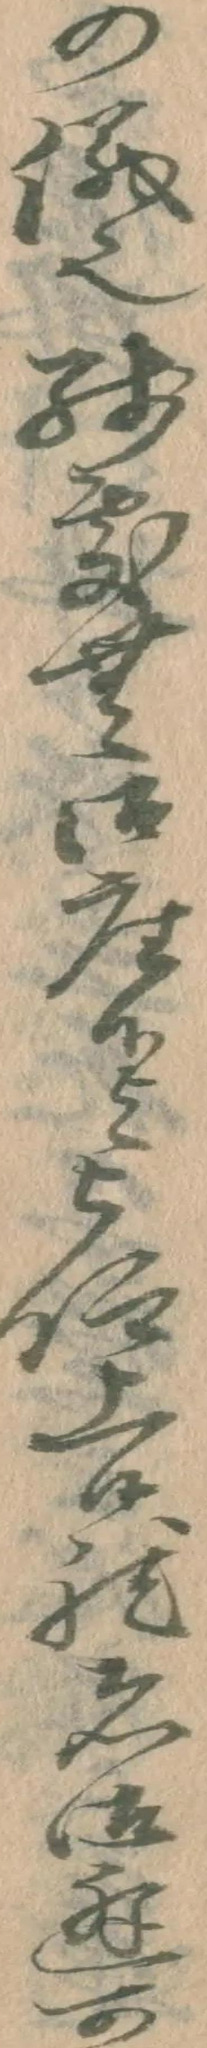の儀也残處無御座候与被仰上候然者御逢可
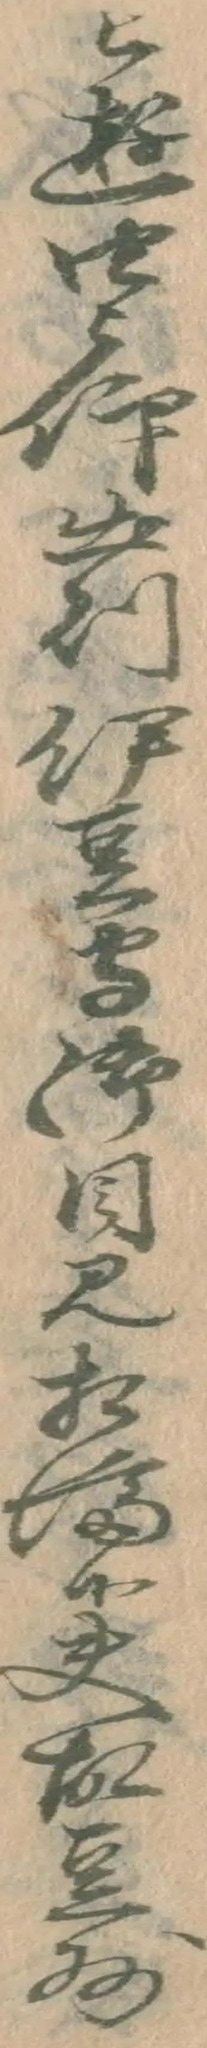被遊由被仰出則伊豆守御目見相備候夫故豆州
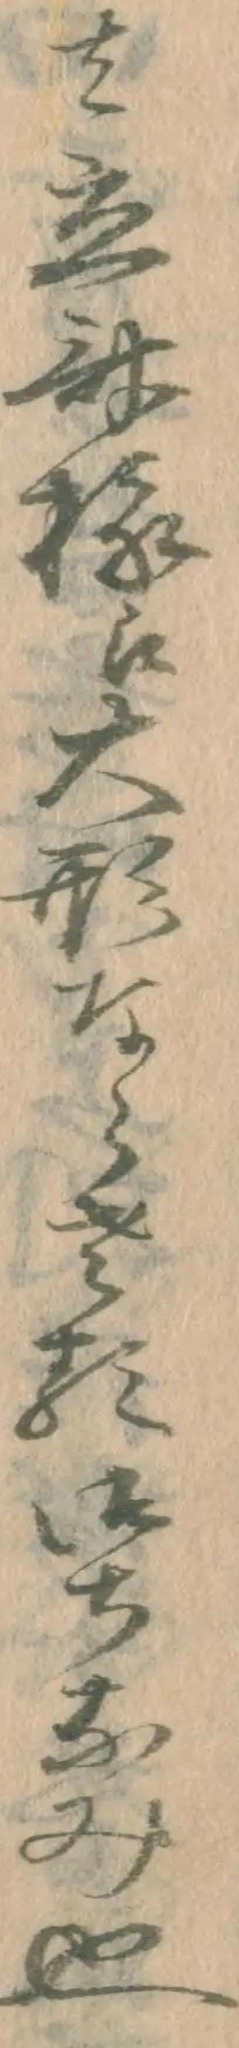者立斎様江大形ならさ類御ちなみ也

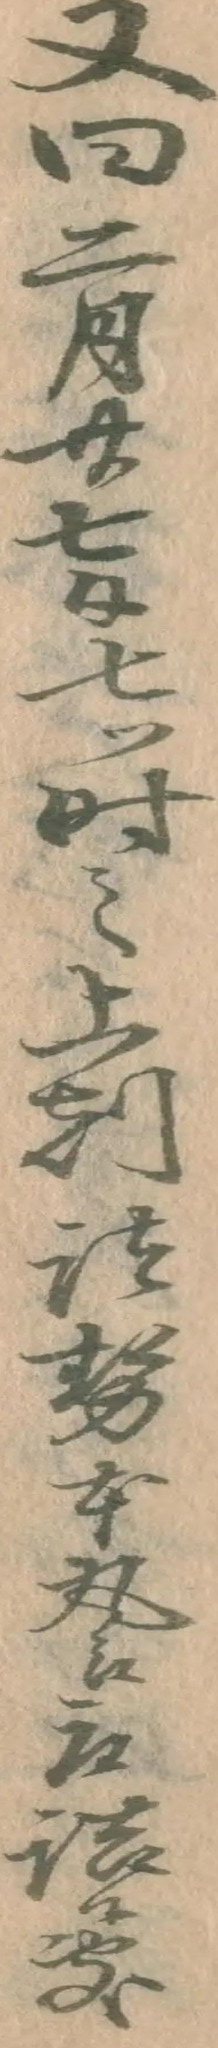又曰二月廿七日七つ時之上刻諸勢本丸江取詰候處
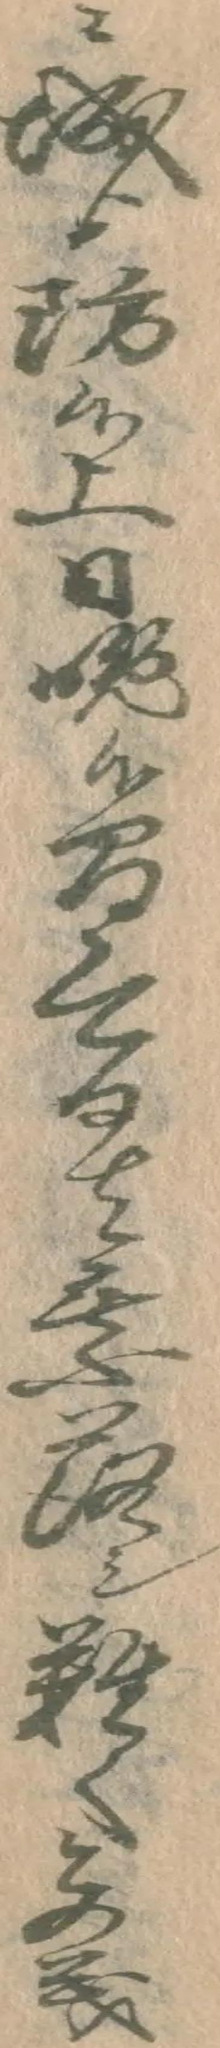に城ゟ防候上日晩候間今日者乗落し難くとの義
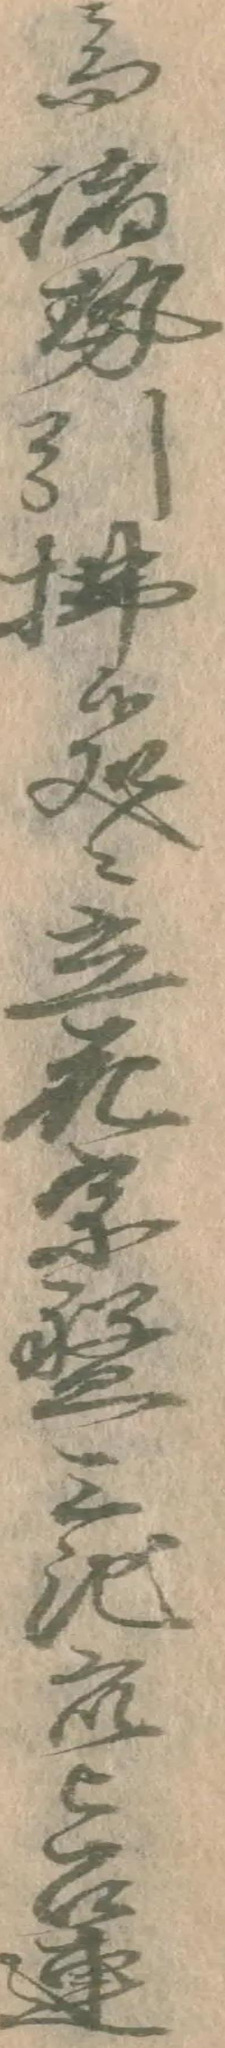に而諸勢引払候処に立花宗盤三池衆被召連
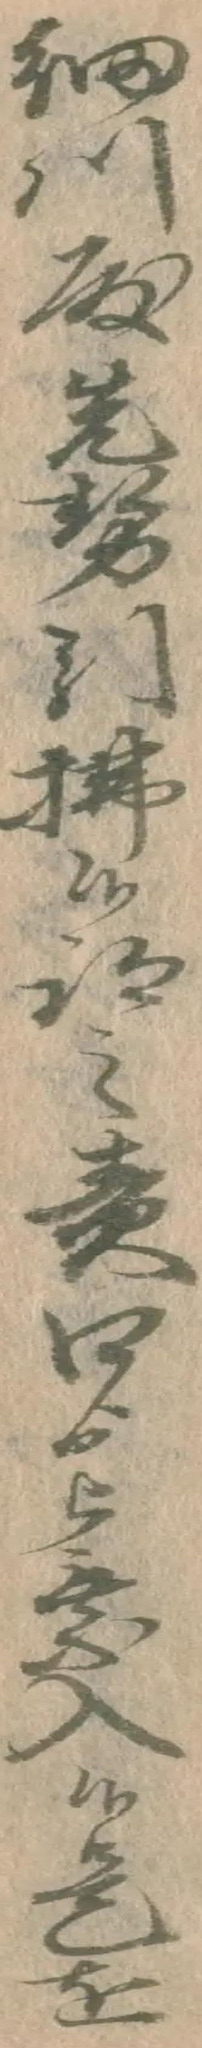細川殿先勢引払候跡之責口ゟ被乗入候是を
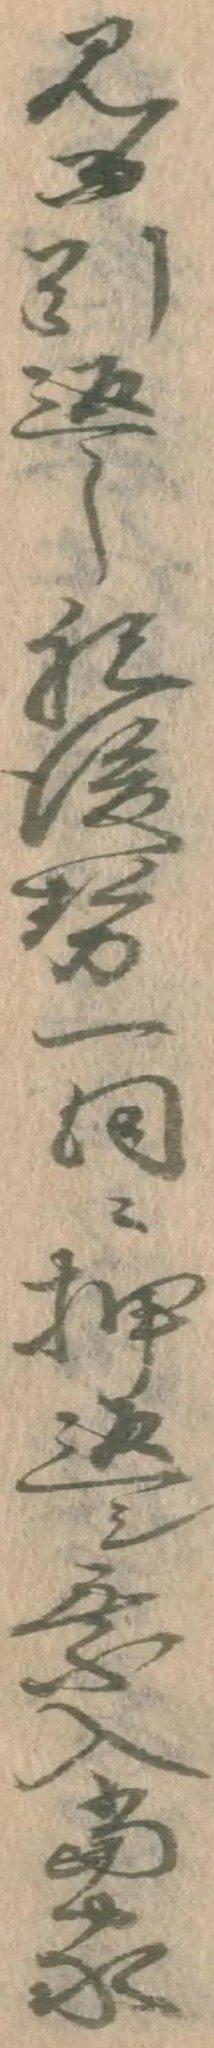見而引返し肥後勢一同に押返し乗入当家
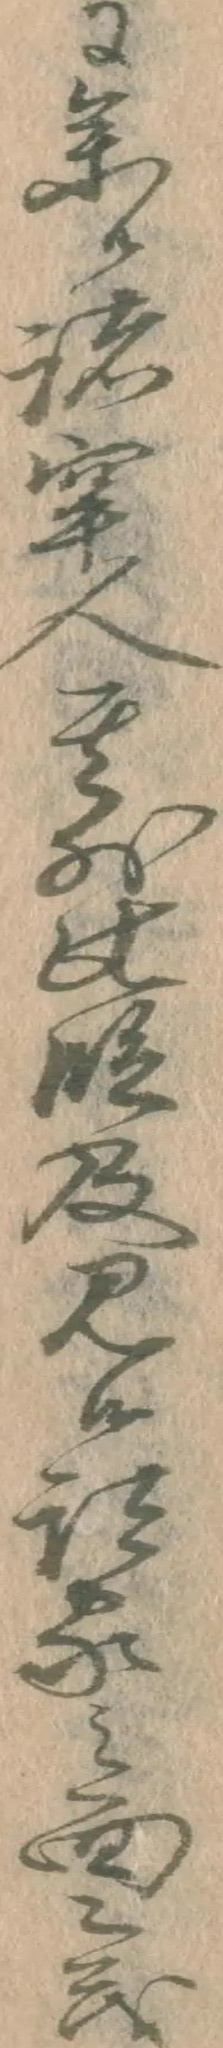尓参り諸牢人其外此段及見候諸家之面々茂
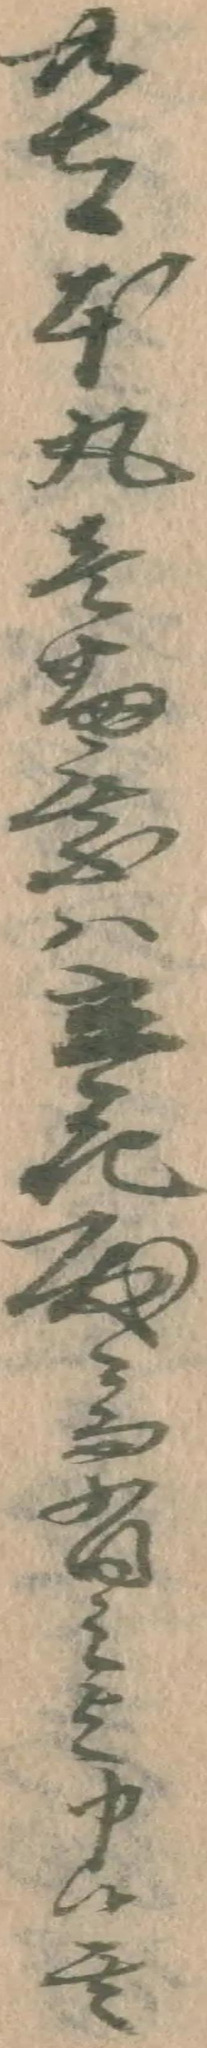廿七日本丸壱番乗は立花殿に而有之与申候其
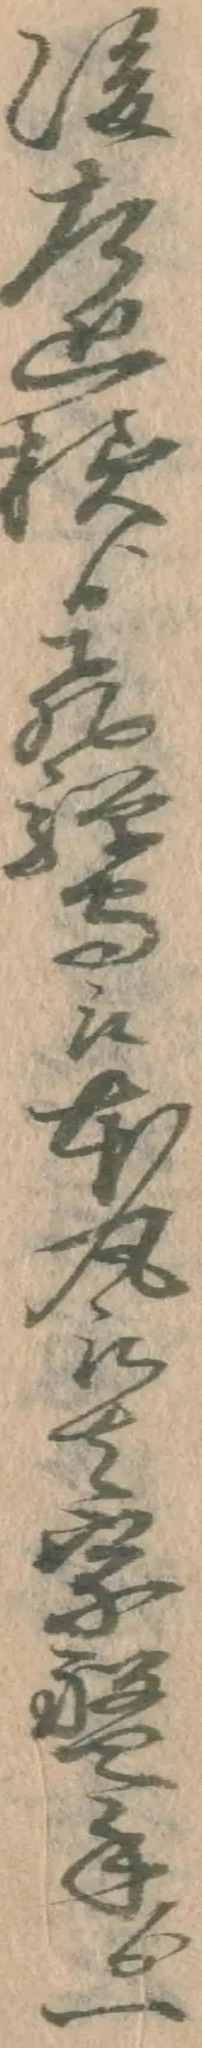後左近様ゟ飛騨守江本丸江者宗盤手ゟ一
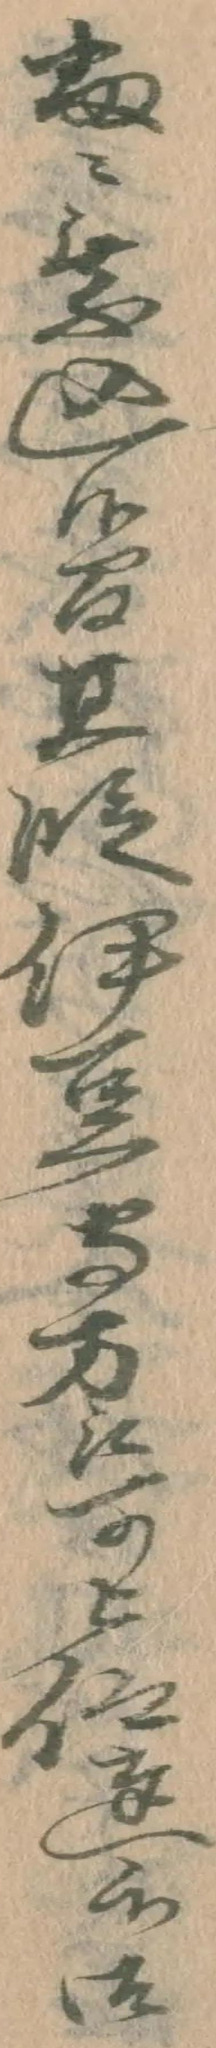番に乗込候間其段伊豆守方江可被仰達候御
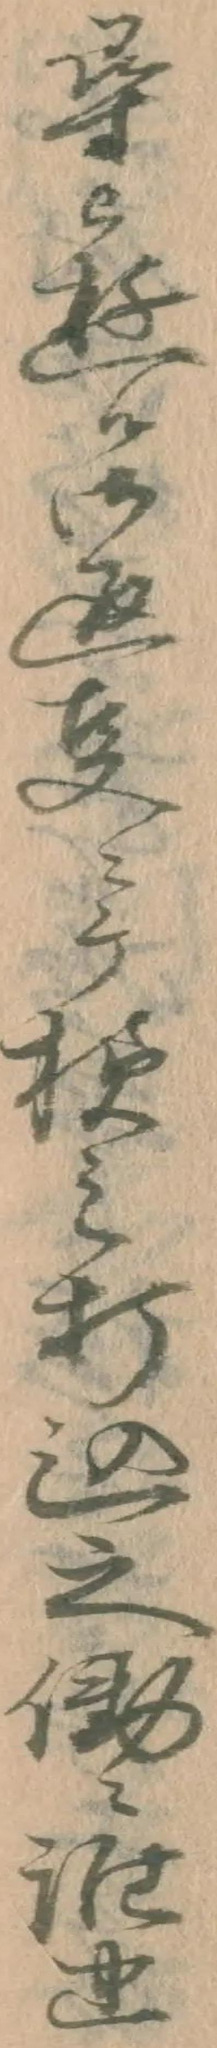尋被遊候御返事にて様之打込之働に誰迚
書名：切支丹御退治記 49巻. [8]
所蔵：国立国会図書館 National Diet Library, JAPAN
